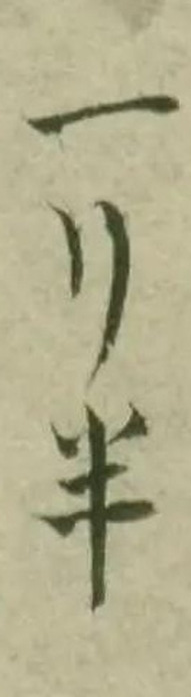一リ半
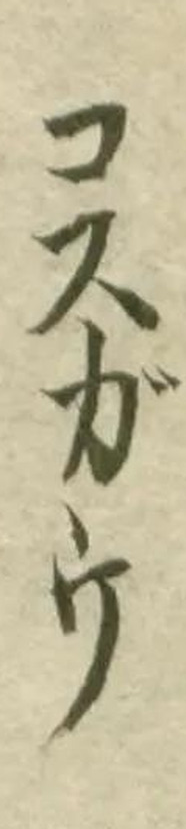コスガウ
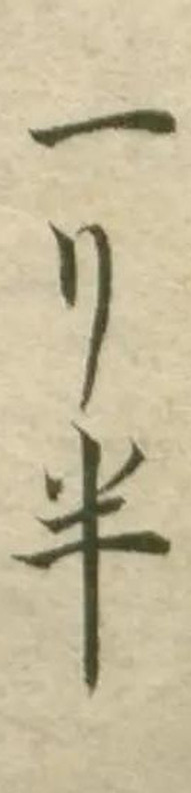一リ半
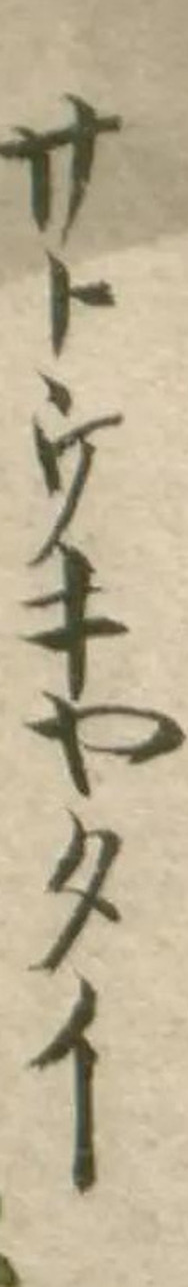サトウキヤタイ
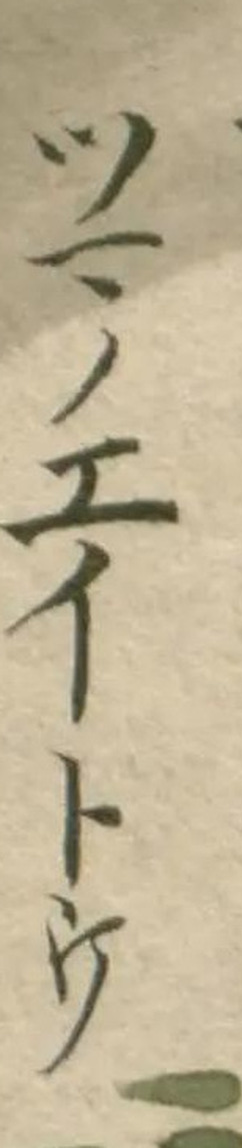ツマノエイトウ

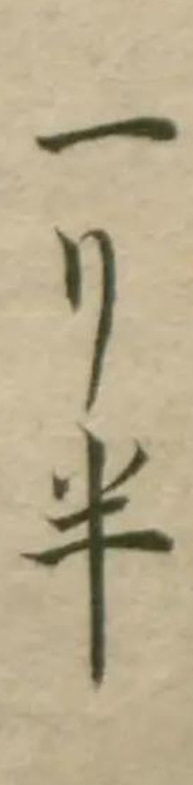一リ半
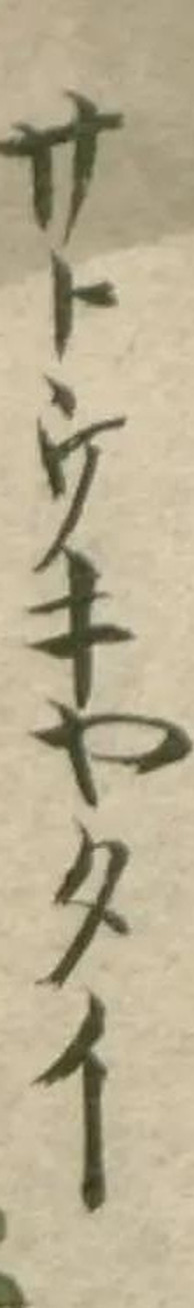サトウキヤタイ
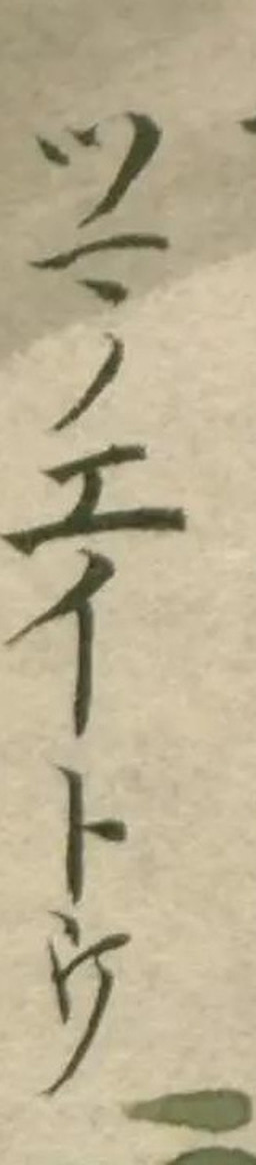ツマノエイトウ
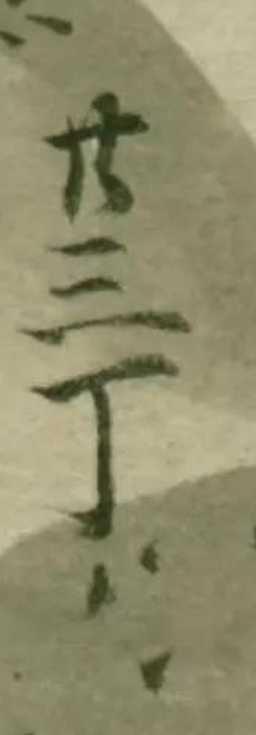廿三丁
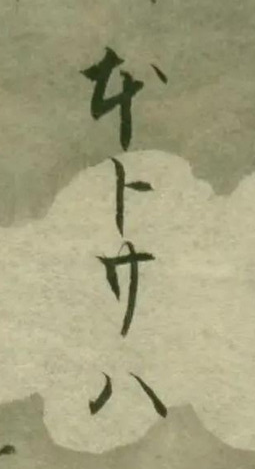本トサハ
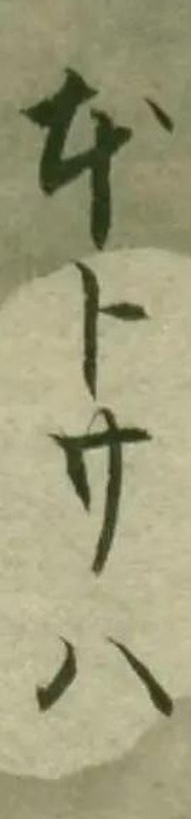本トサハ
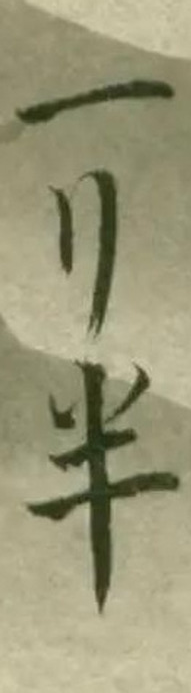一リ半
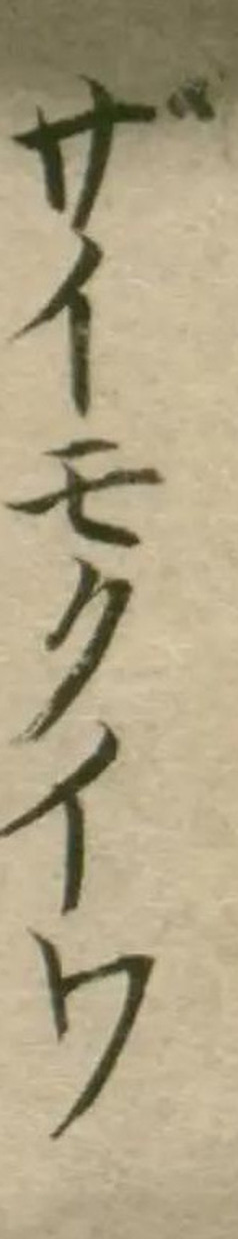ザイモクイワ

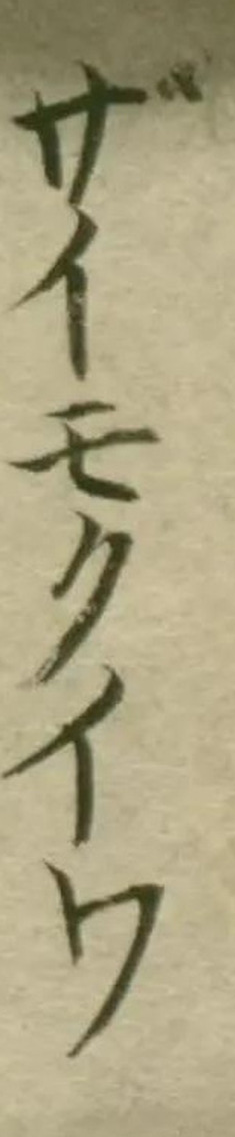ザイモクイワ
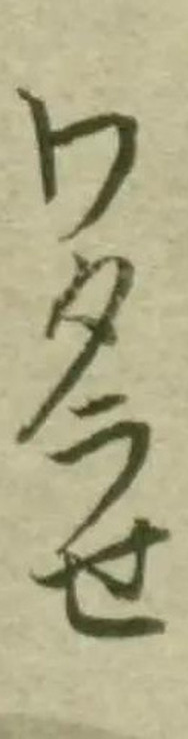ワタラセ
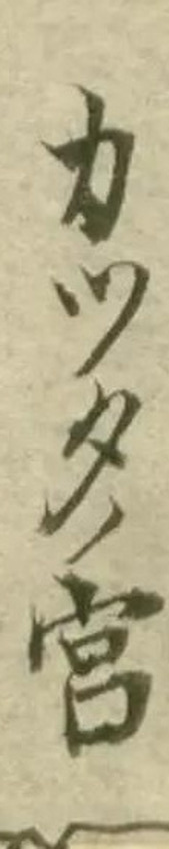カツタノ宮
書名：江戸より奥州津輕迄道筋之圖
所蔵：国立国会図書館 National Diet Library, JAPAN
